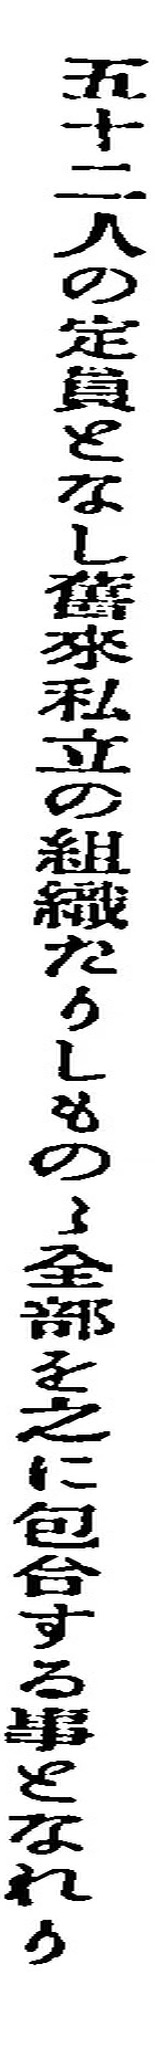五十二人の定員となし舊來私立の組織たりしものゝ全部を之に包合する事となれり
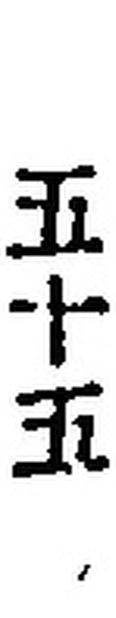五十五

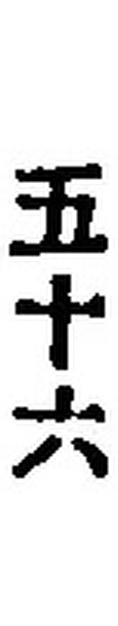五十六
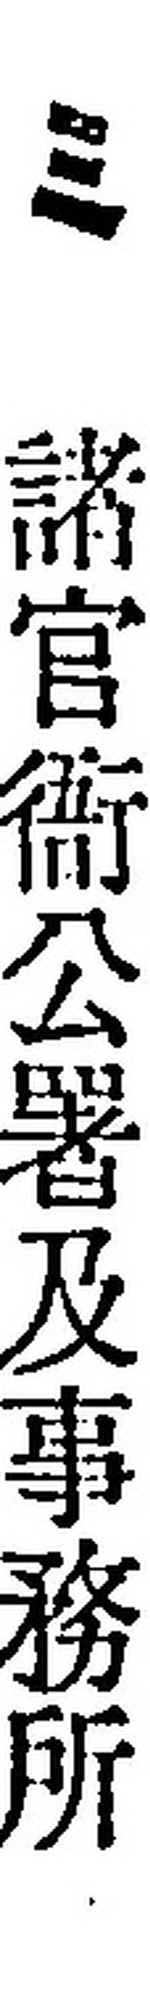ミ諸官衙公署及事務所
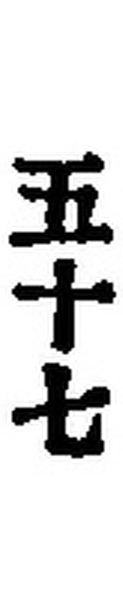五十七

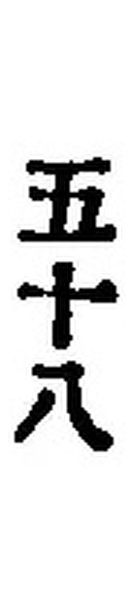五十八
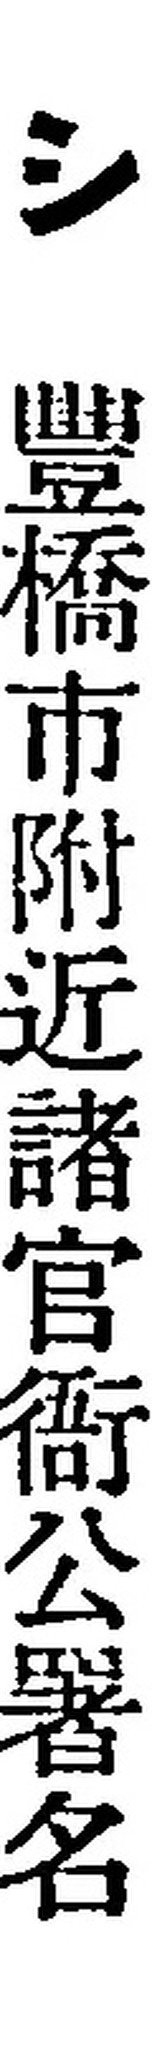シ豐橋市附近諸官衙公署名
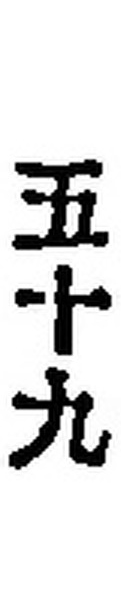五十九

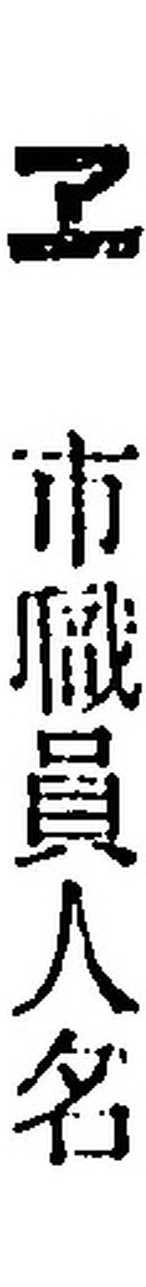ヱ市職員人名
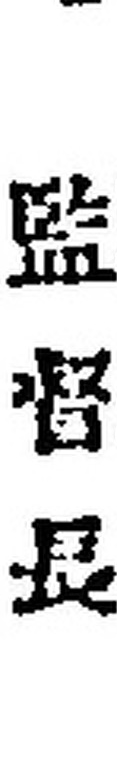監督長
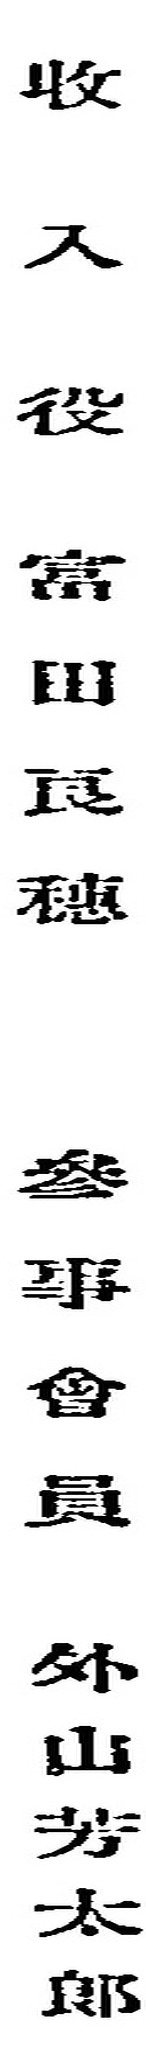収入役富田良穗參事會員外山芳太郞
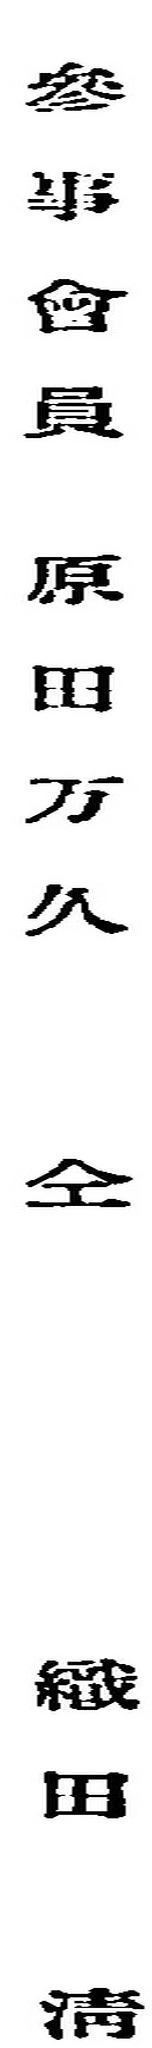參事会員原田万久仝織田淸
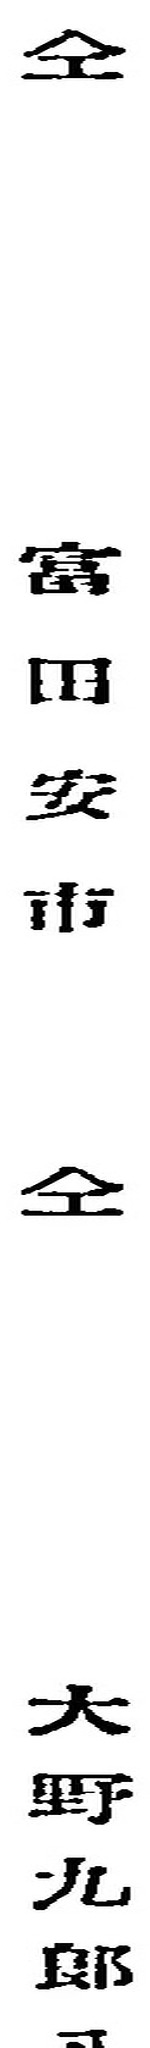仝富田安市仝大野九郞八
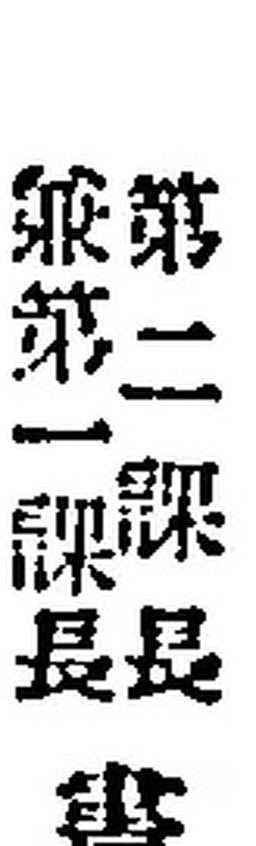兼第一課長
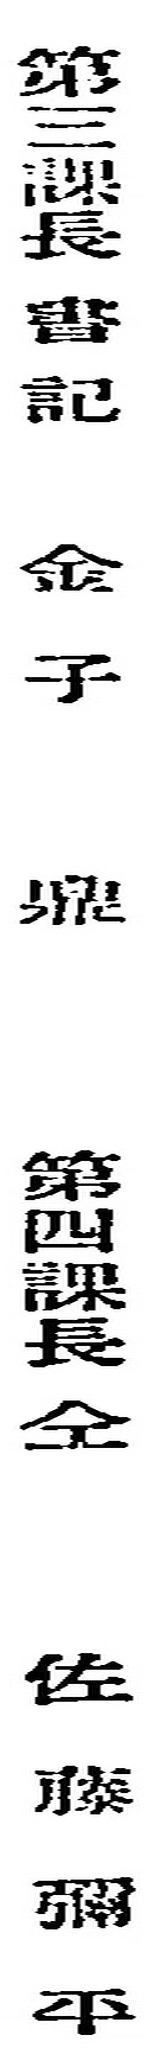第三課長書記金子鼎第四課長仝佐藤彌平
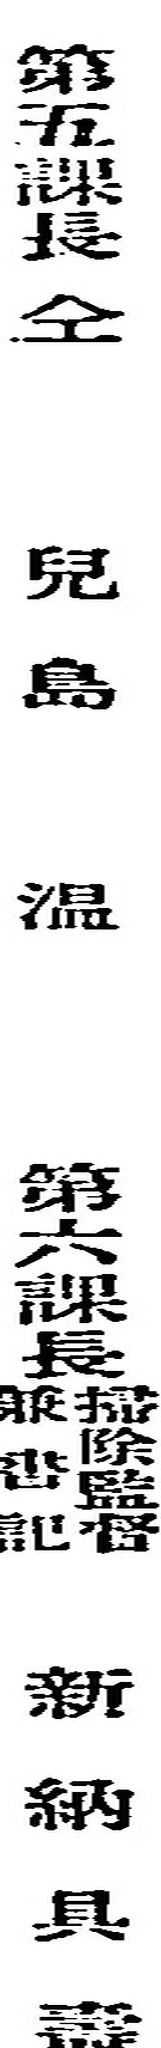第五課長仝兒島温第六課長掃除監督新納具壽
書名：豊橋志要
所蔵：国立国会図書館 National Diet Library, JAPAN
